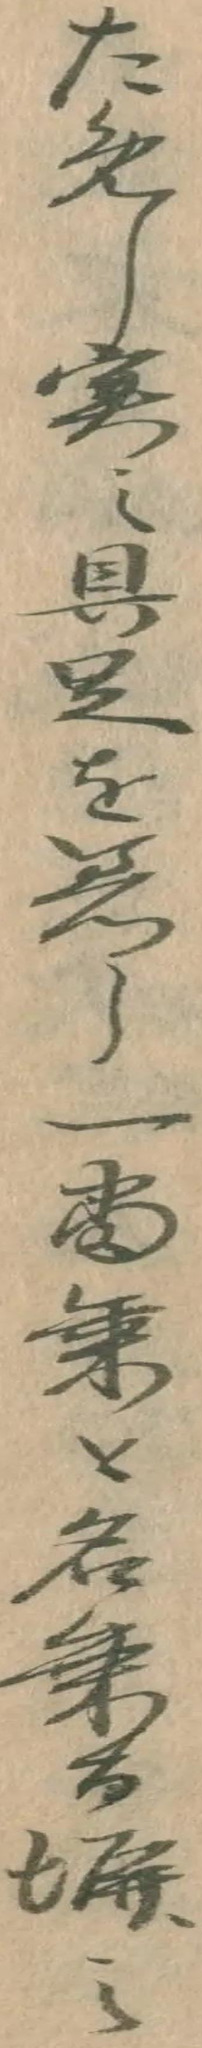た免し実之具足を着し一番乗と名乗而塀之

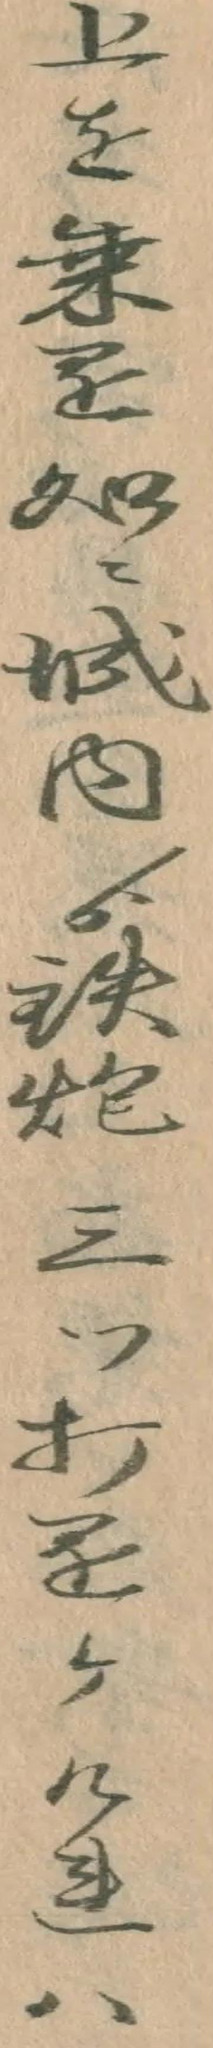上を乗懸処に城内ゟ鉄炮三つ打懸け介連は
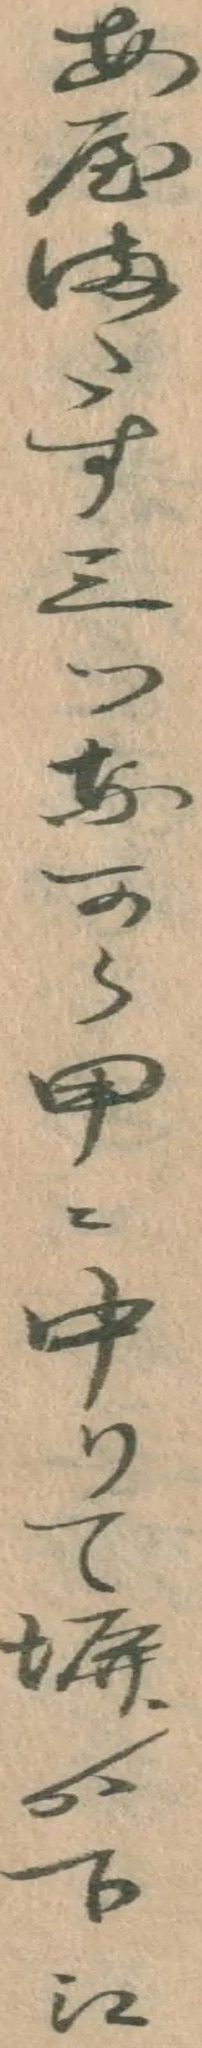あ屋満たす三つな可ら甲に中りて塀ゟ下江
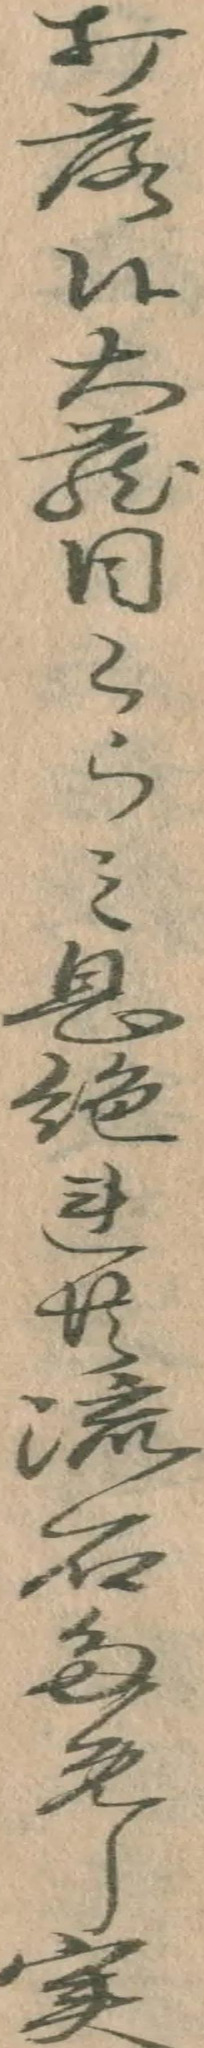打落候大蔵目くら之息絶連共流石多免し実
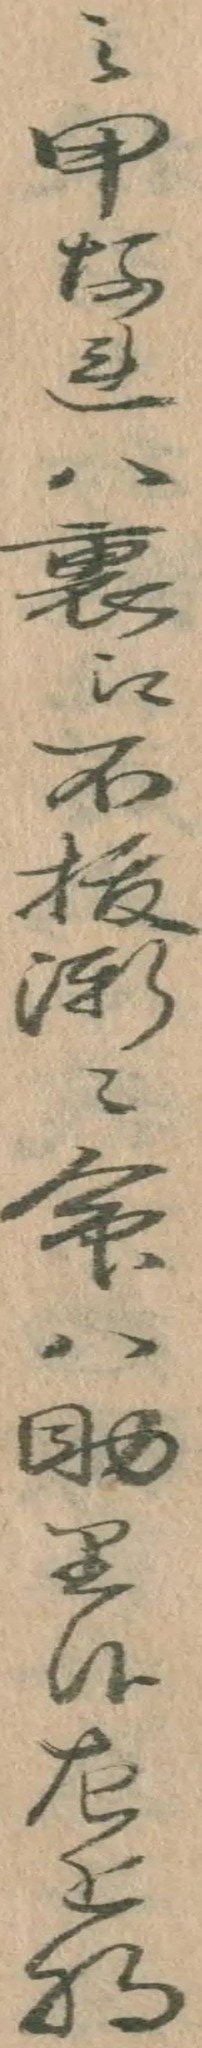之甲な連は裏江不抜瀬に命は助里候左近将
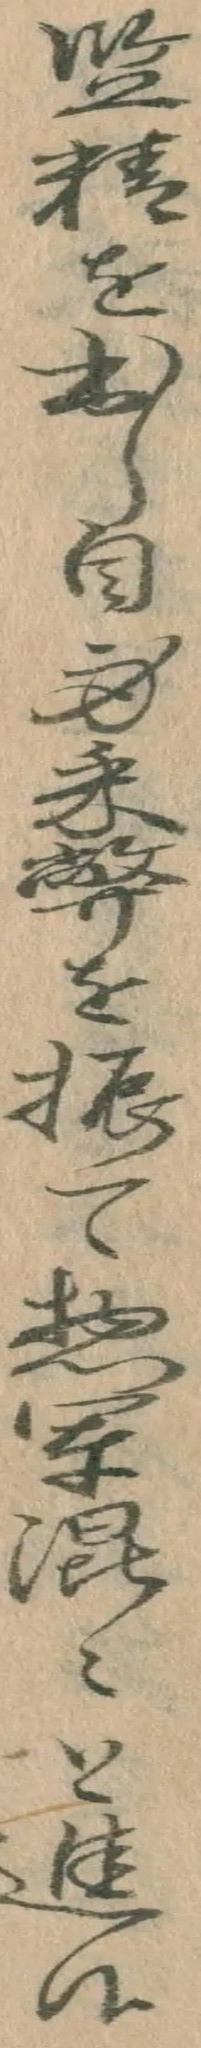監精を出し自身采幣を振て惣軍混々と進候
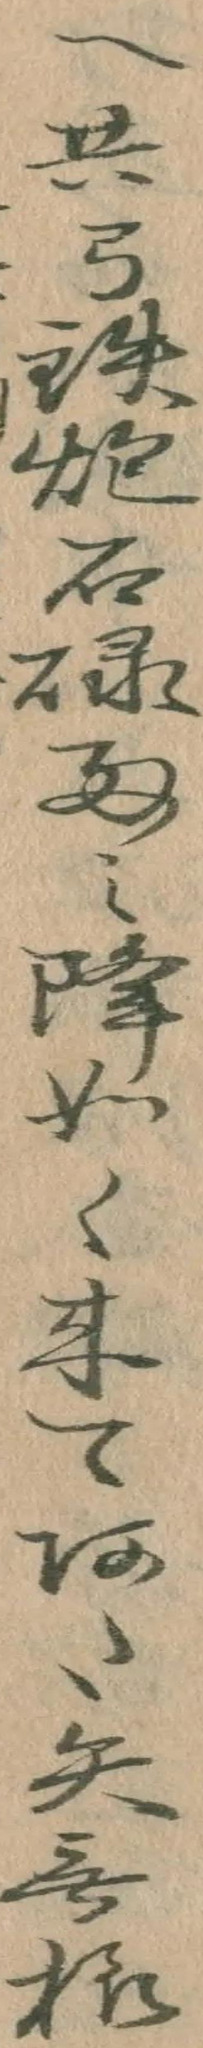へ共弓鉄炮石碌多之降如く来て阿た矢無様
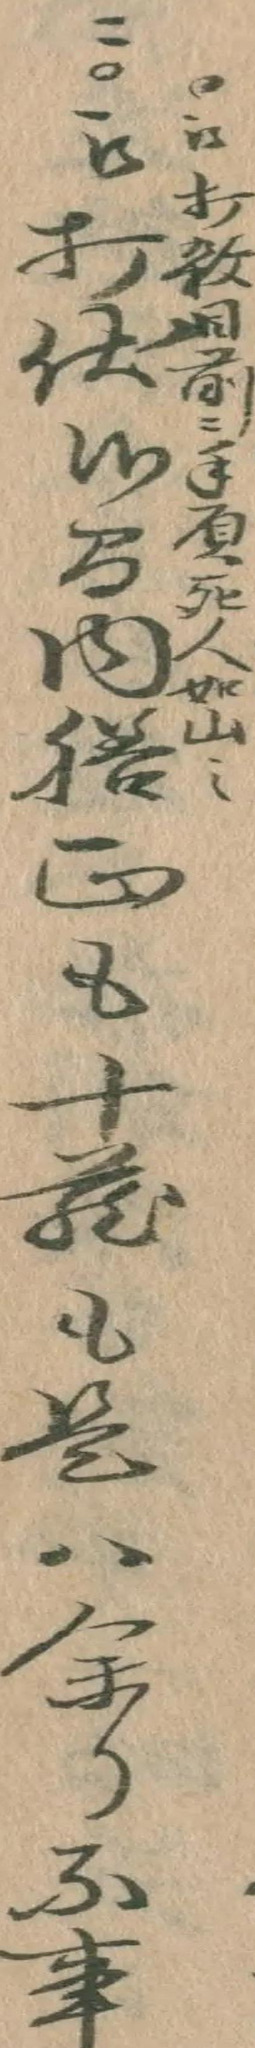に被打仕候間内膳正も十蔵も是は余りふ事
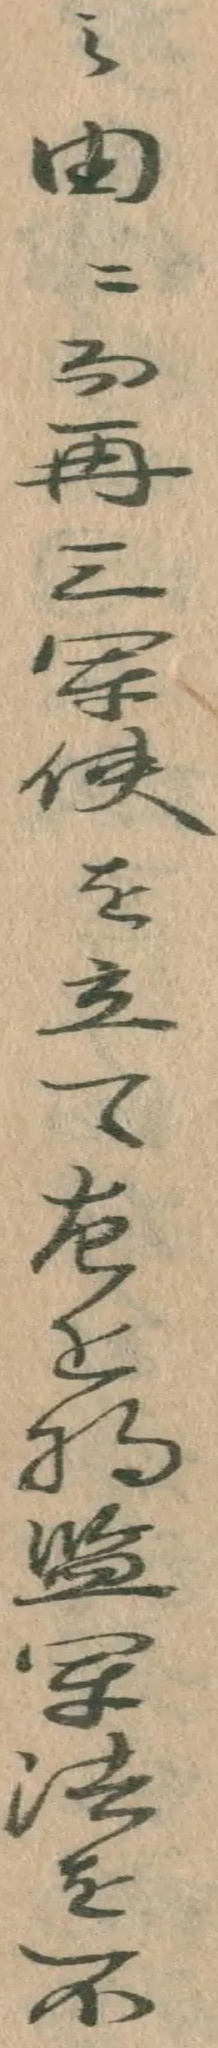之由に而再三軍使を立て左近将監軍法を不
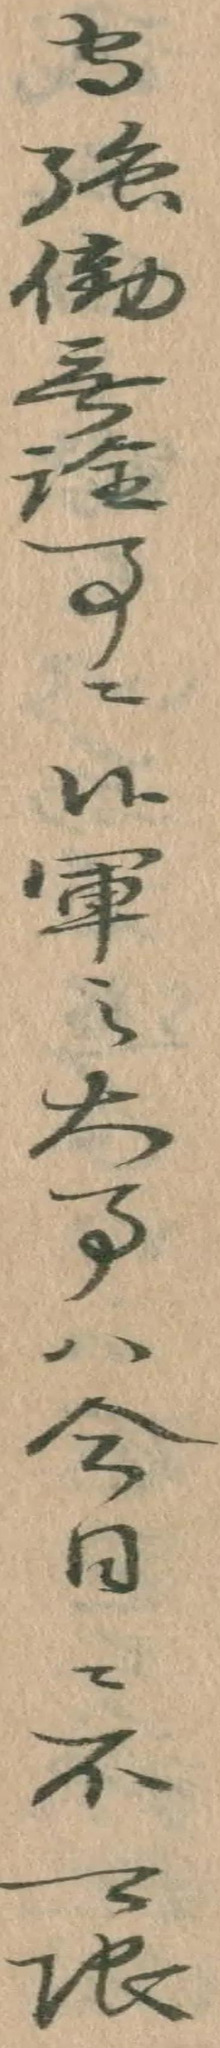守強働無詮事に候軍之大事は今日に不可限
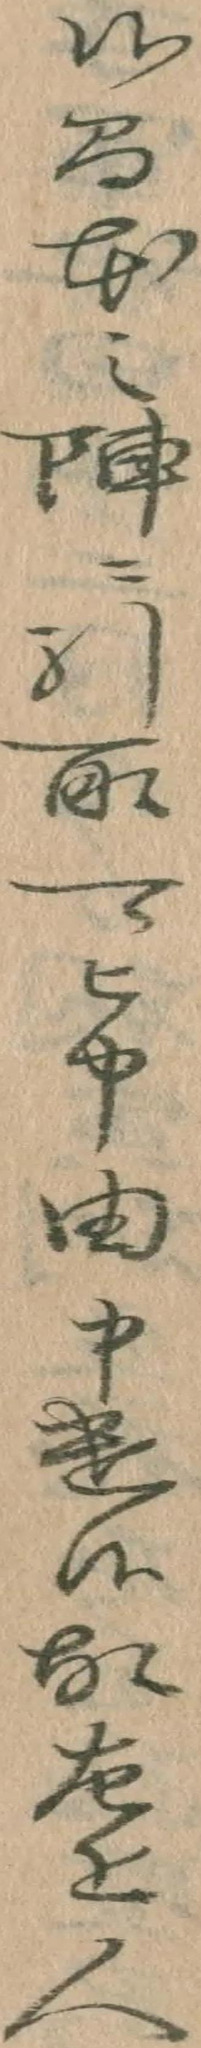候間本之陣に引取可被申由申遣候故左近人
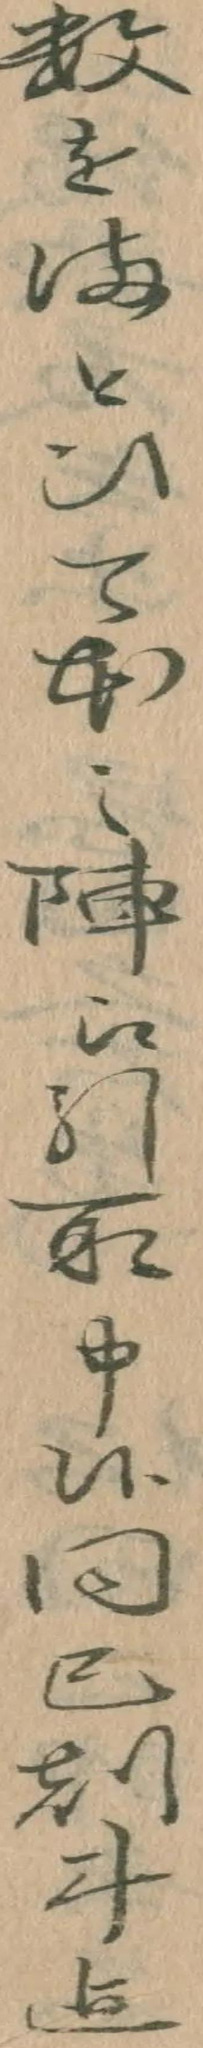数を備とひて本之陣江引取申候同巳刻斗迄
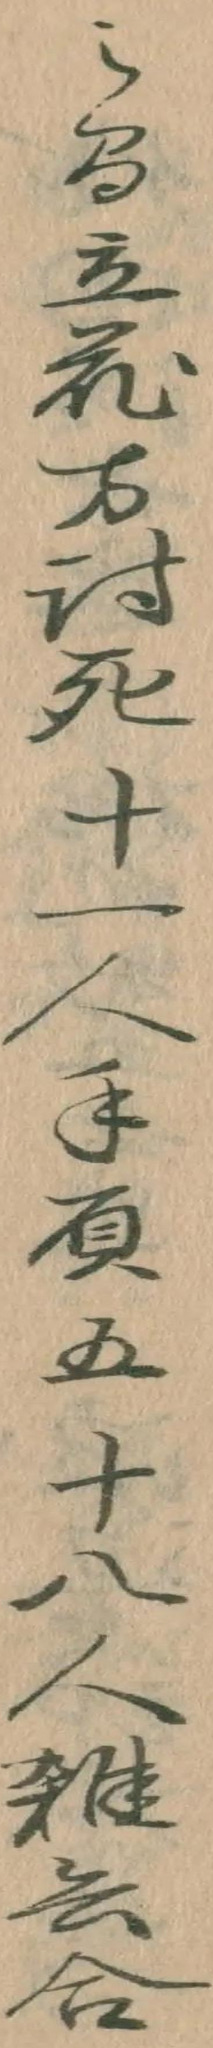之間立花方討死十一人手負五十八人雑兵合
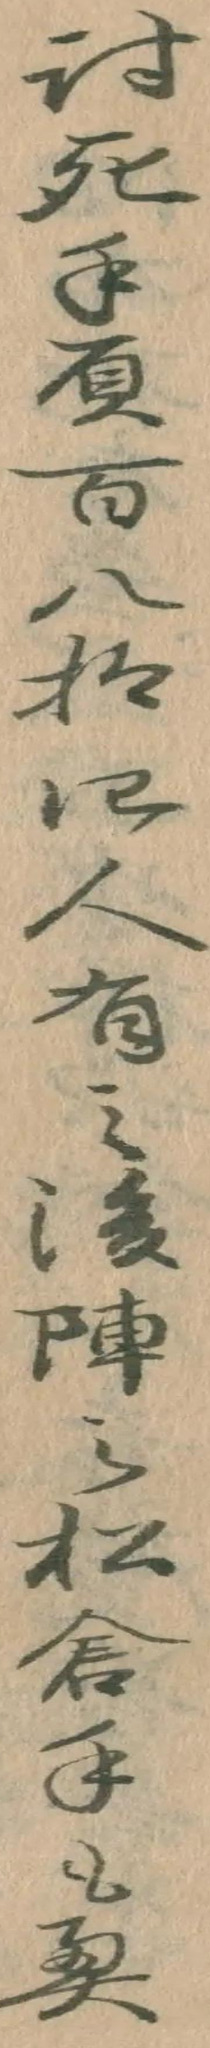討死手負百八拾四人有之後陣之松倉手も奥
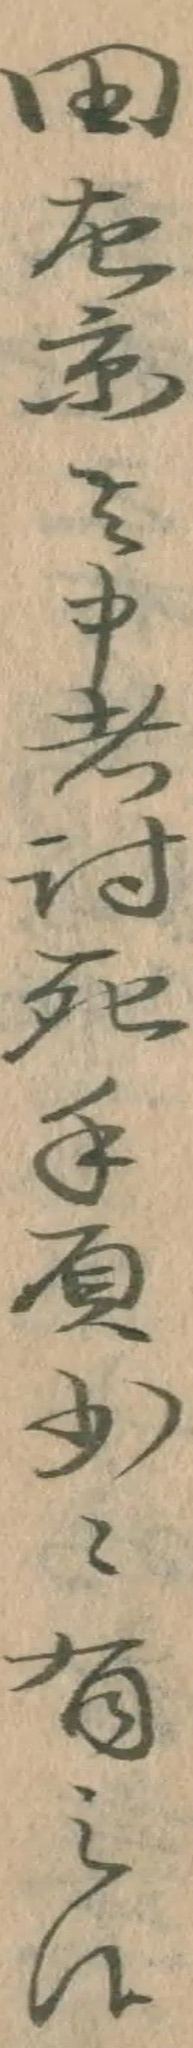田左京与申者討死手負少々有之候
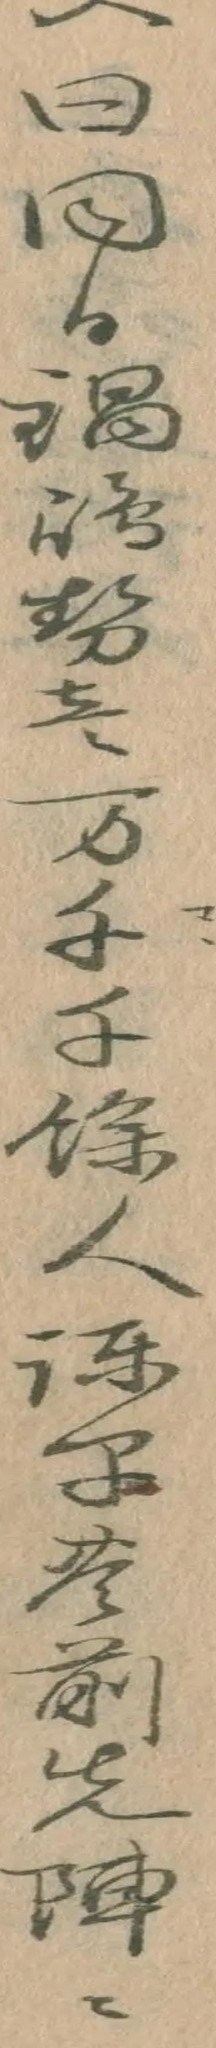又曰同日鍋島勢壱万千千余人諌早豊前先陣に
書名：切支丹御退治記 49巻. [4]
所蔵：国立国会図書館 National Diet Library, JAPAN
